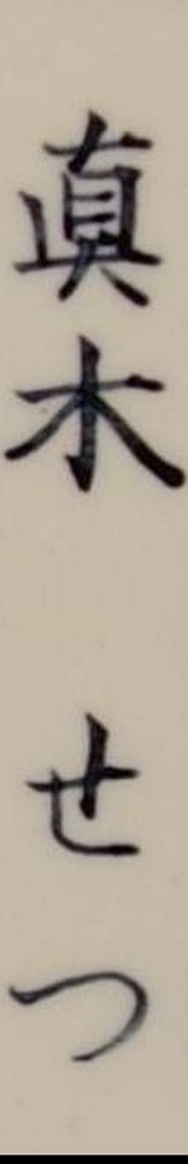真木せつ
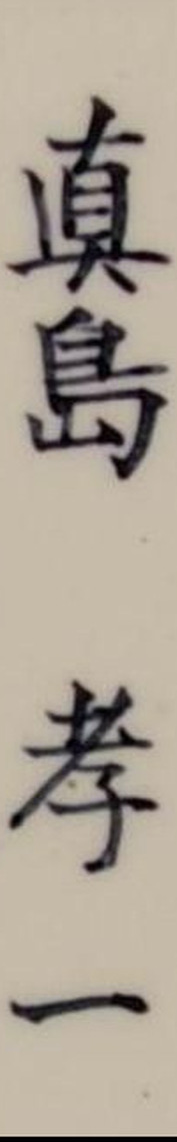真島孝一
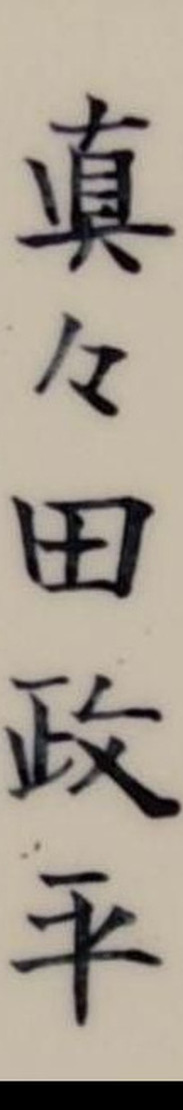真々田政平
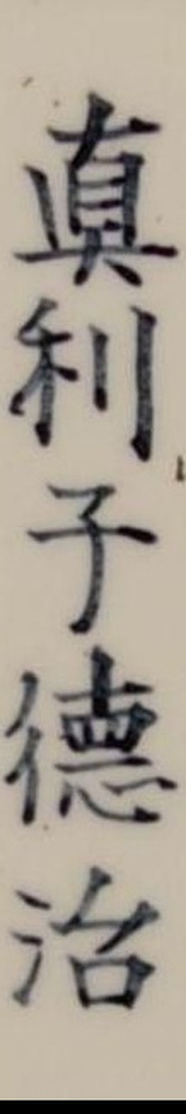真利子徳治
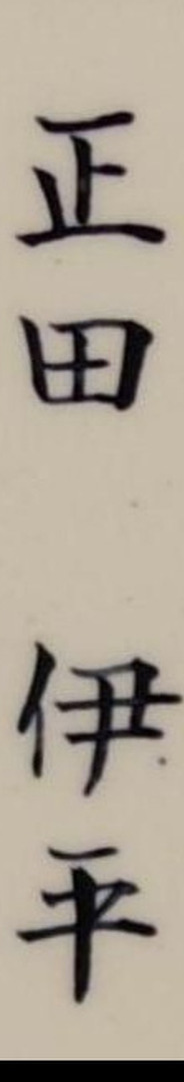正田伊平
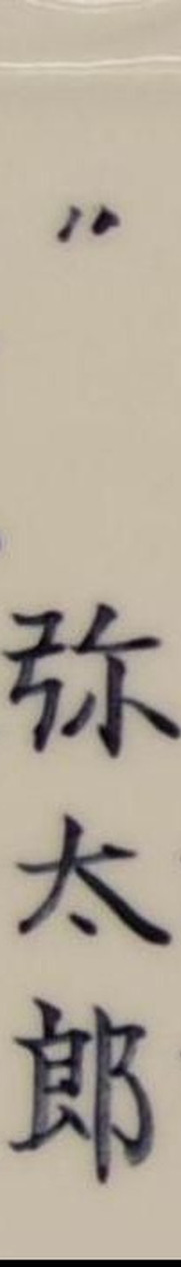弥太郎
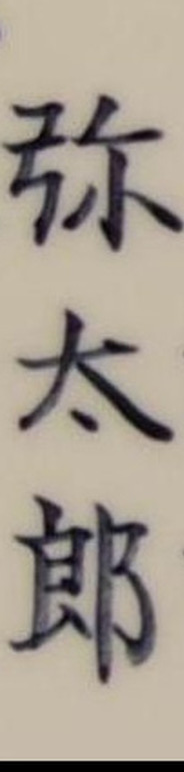弥太郎
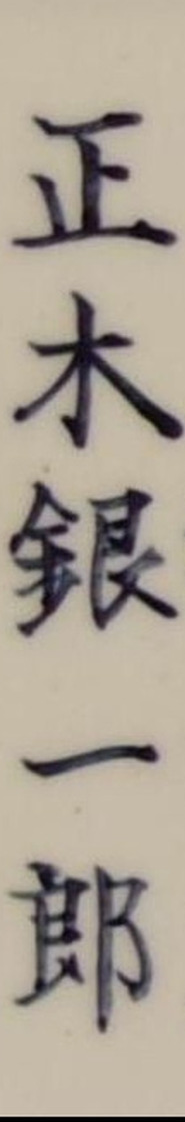正木銀一郎
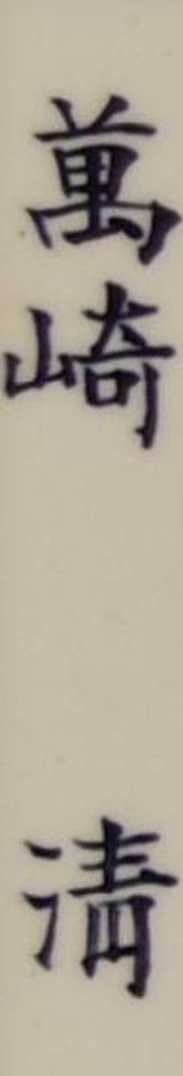萬崎清

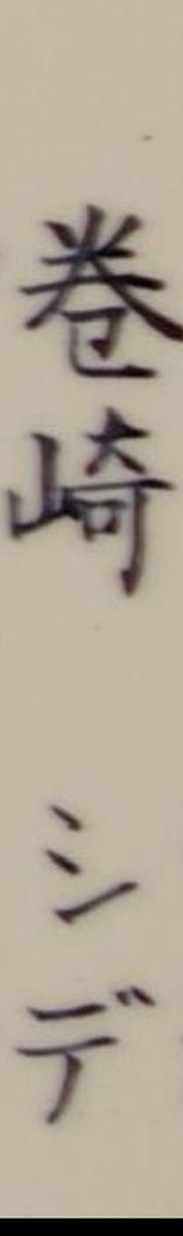巻崎シデ
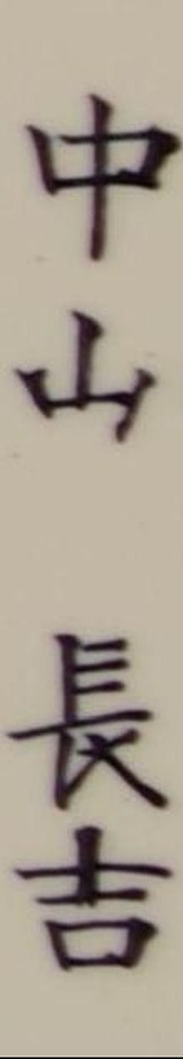中山長吉
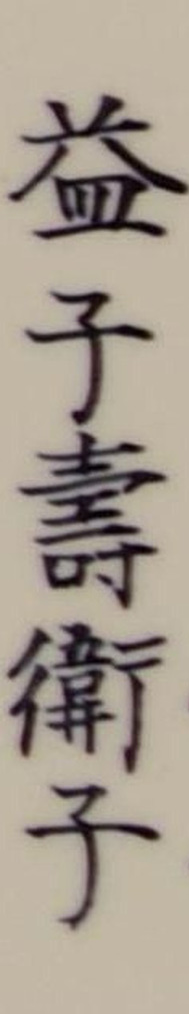益子壽衛子
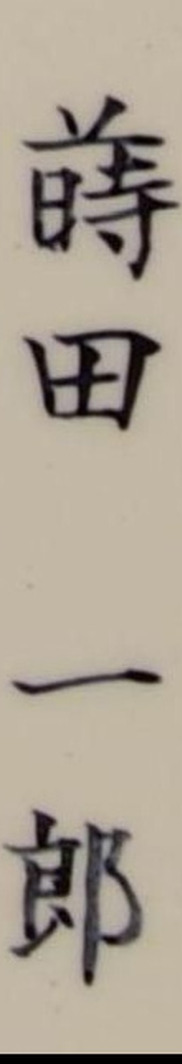蒔田一郎
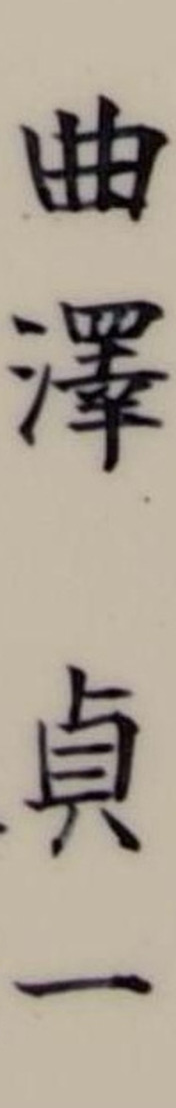曲澤貞一
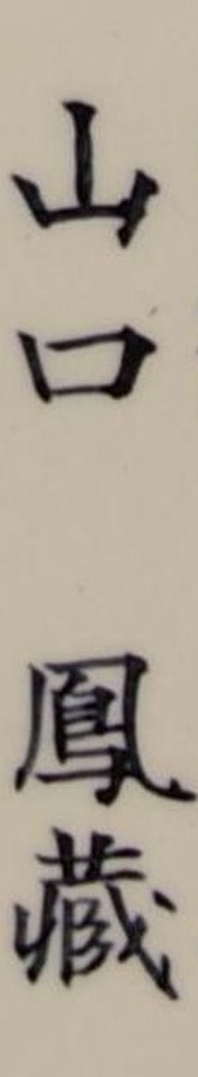山口鳳蔵
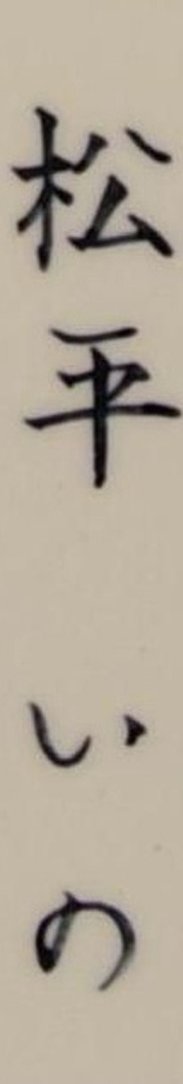松平いの
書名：E~L
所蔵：高野山金剛峯寺
